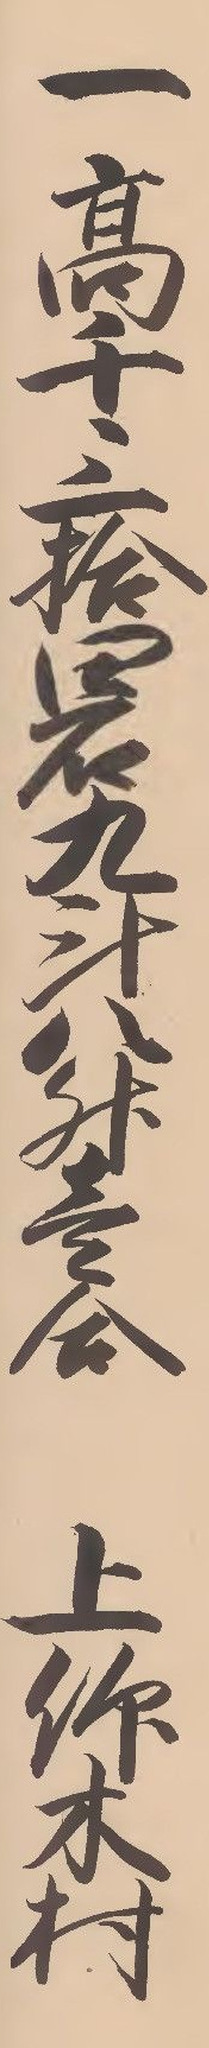一高千三拾四石九斗八升壱合上仰木村
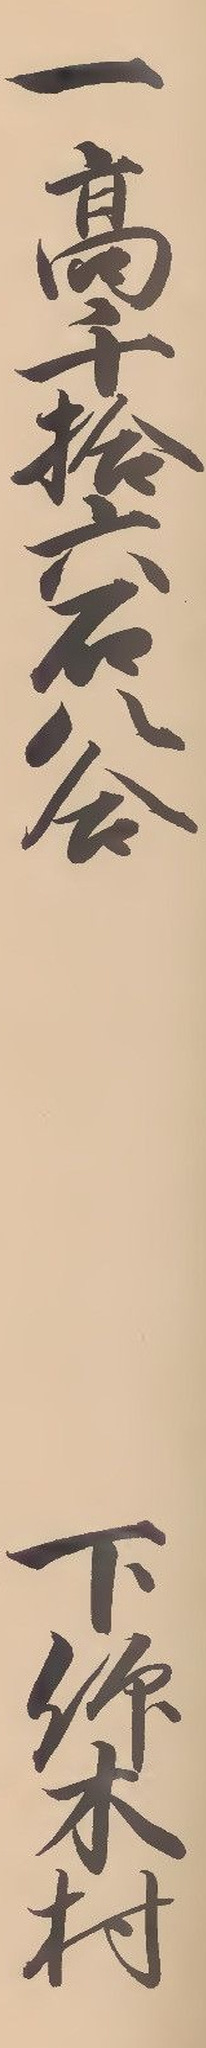一高千拾六石八合下仰木村
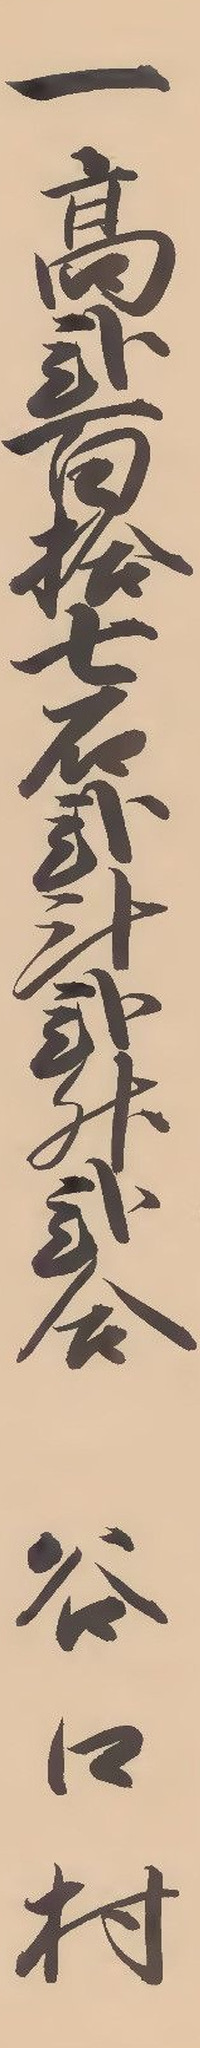一高弐百拾七石弐斗弐升弐合谷口村
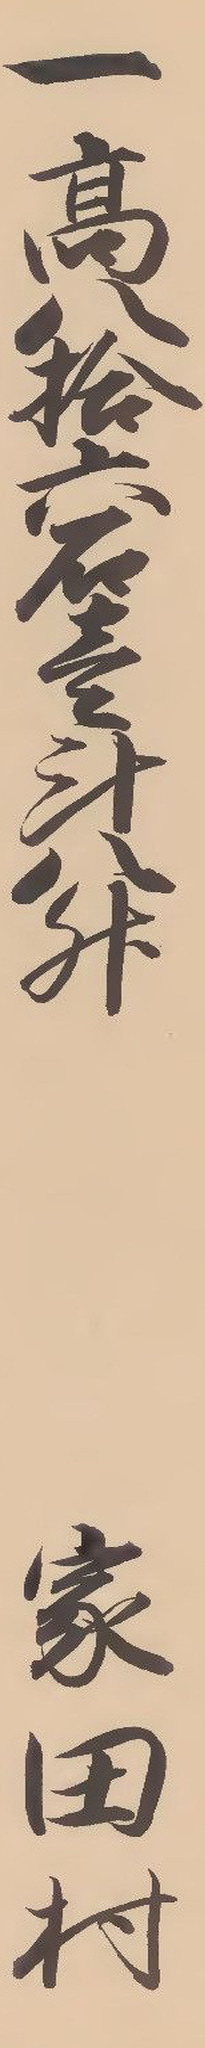一高八拾六石壱斗八升家田村
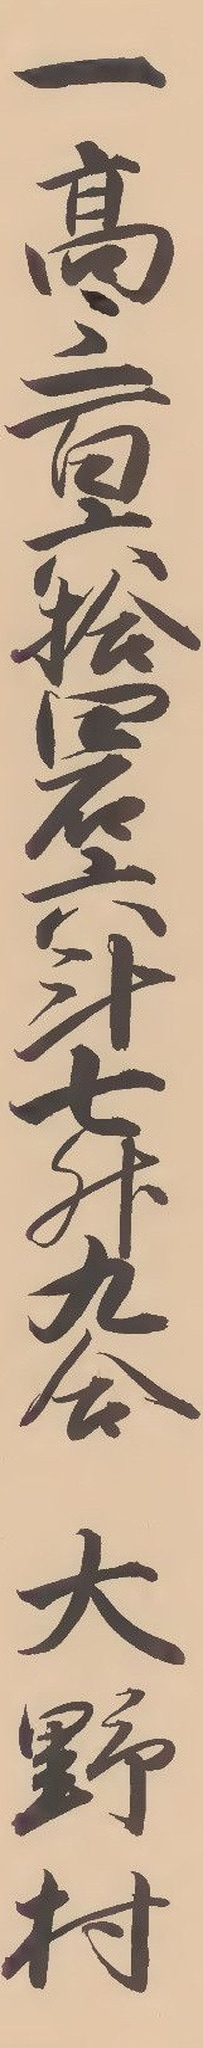一高三百六拾四石六斗七升九合大野村

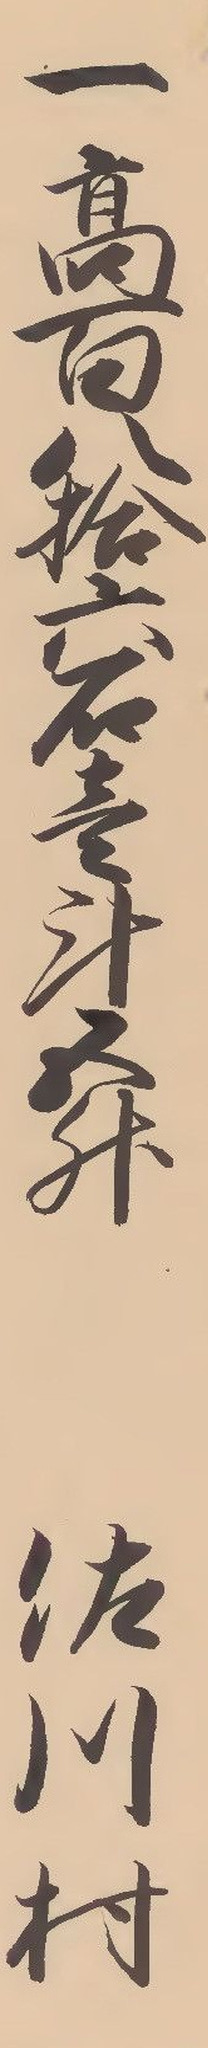一高百八拾六石壱斗五升佐川村
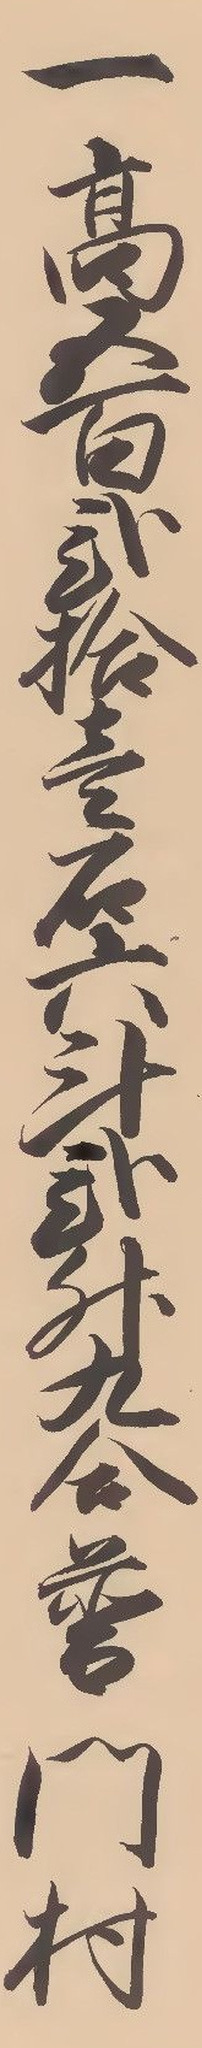一高五百弐拾壱石六斗弐升九合普門村
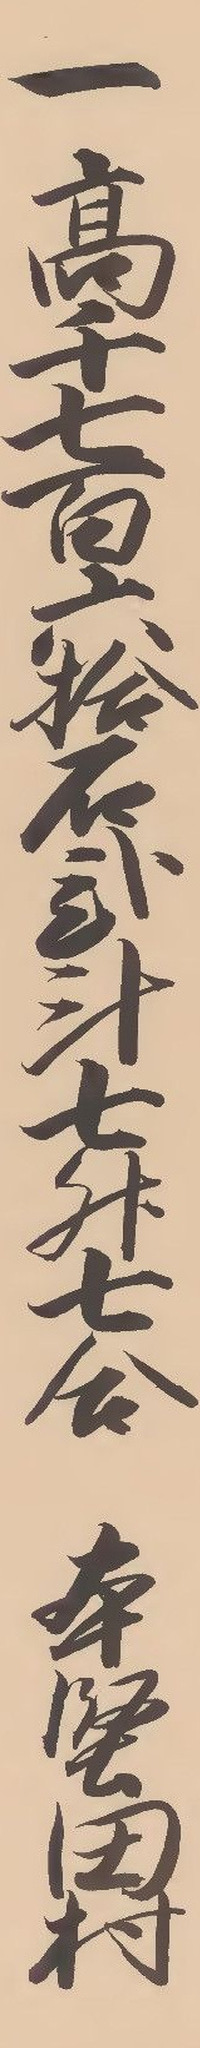一高千七百六拾石弐斗七升七合本堅田村
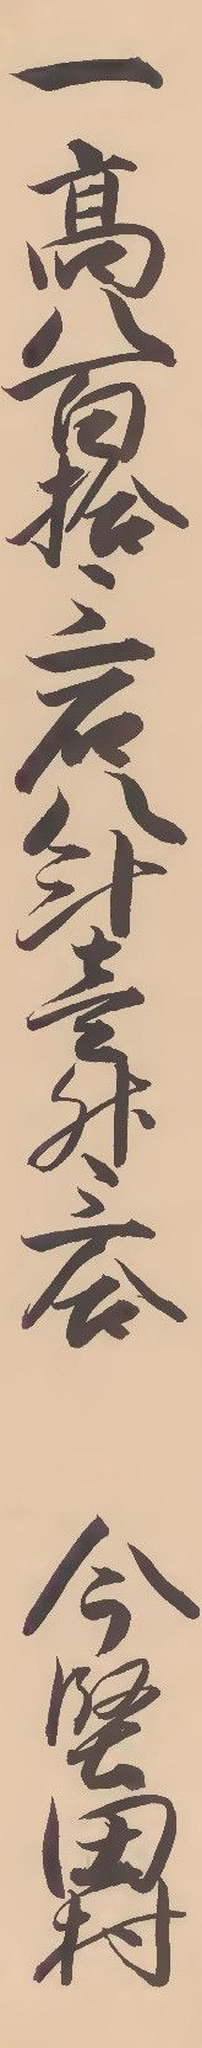一高八百拾三石八斗壱升三合今堅田村

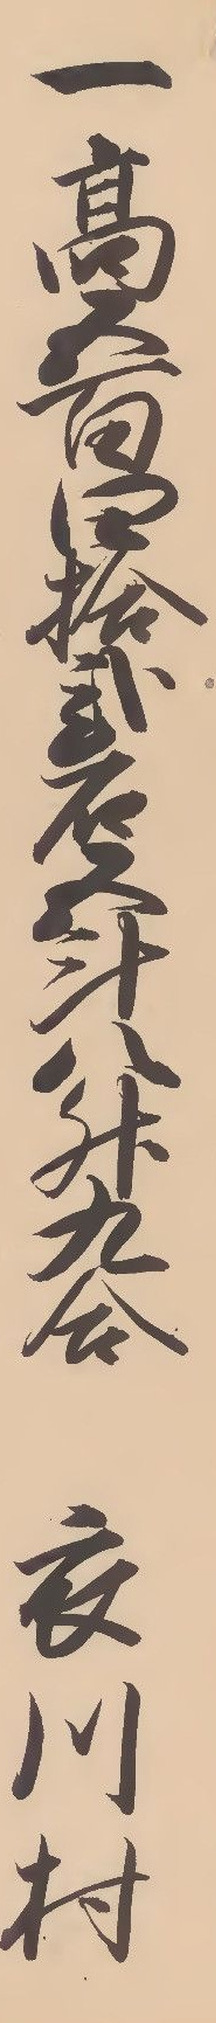一高五百四拾弐石五斗八升九合衣川村
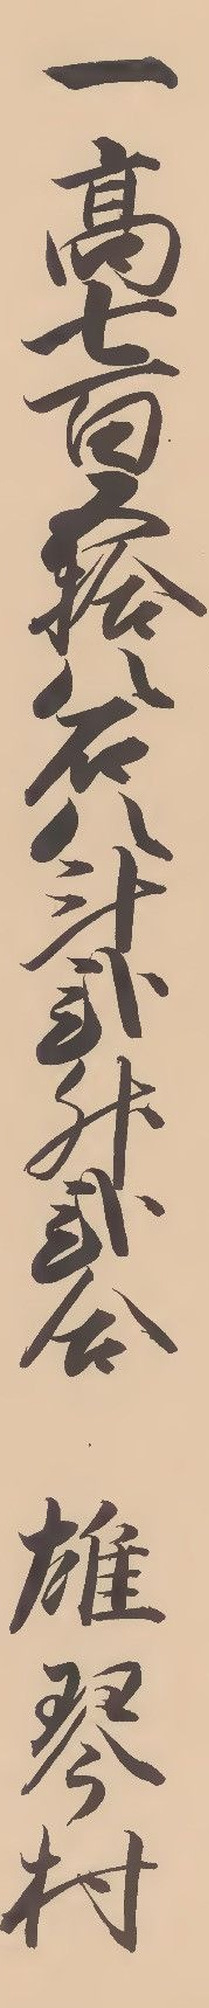一高七百五拾八石八斗弐升弐合雄琴村
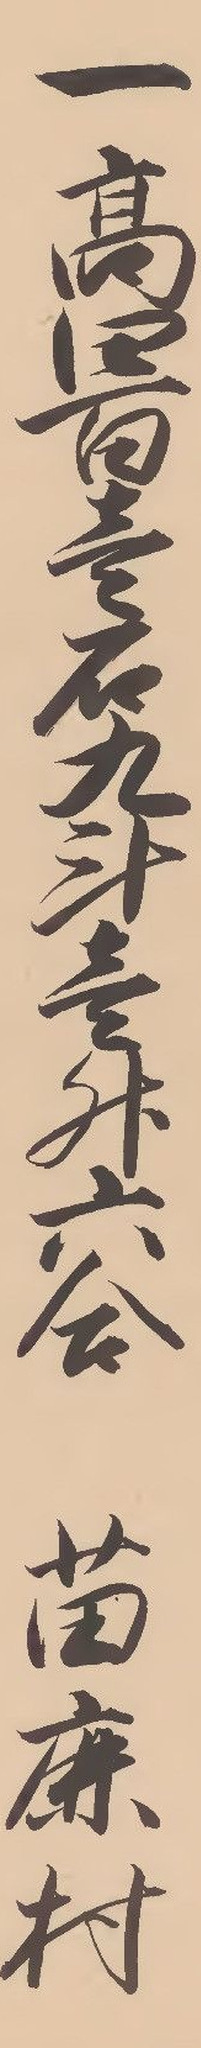一高四百壱石九斗壱升六合苗鹿村
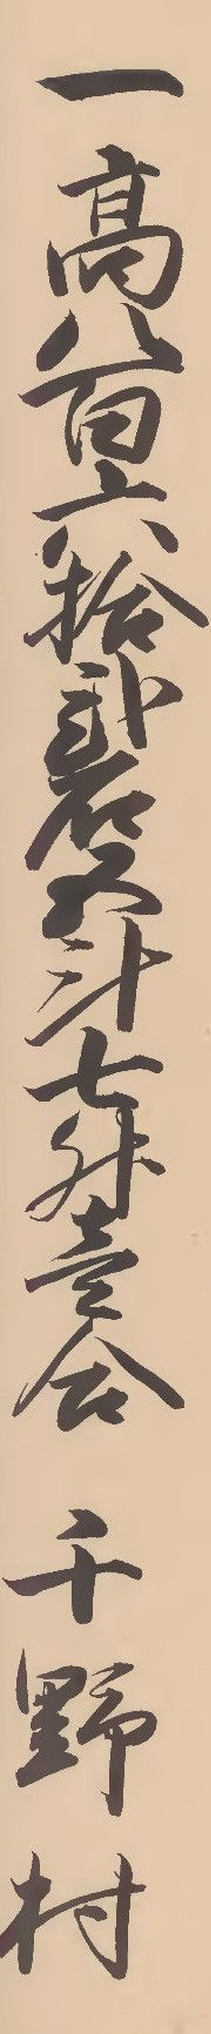一高八百六拾弐石五斗七升壱合千野村
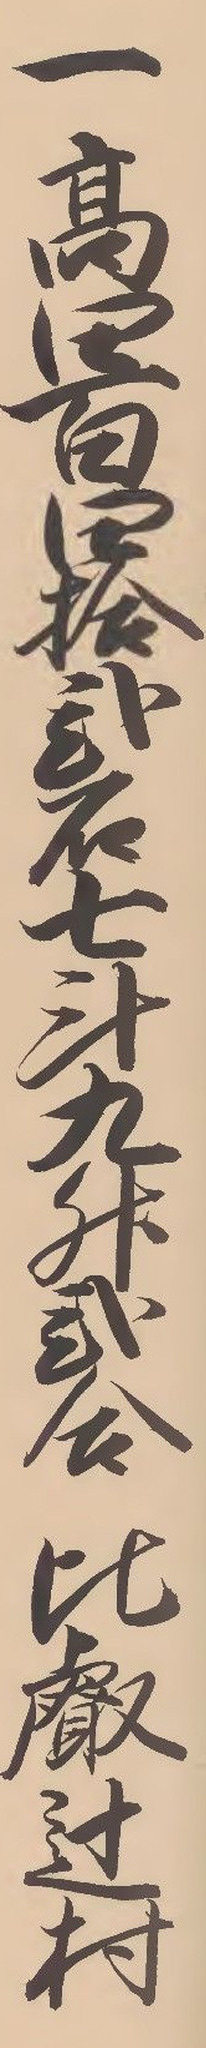一高四百四拾弐石七斗九升弐合比叡辻村
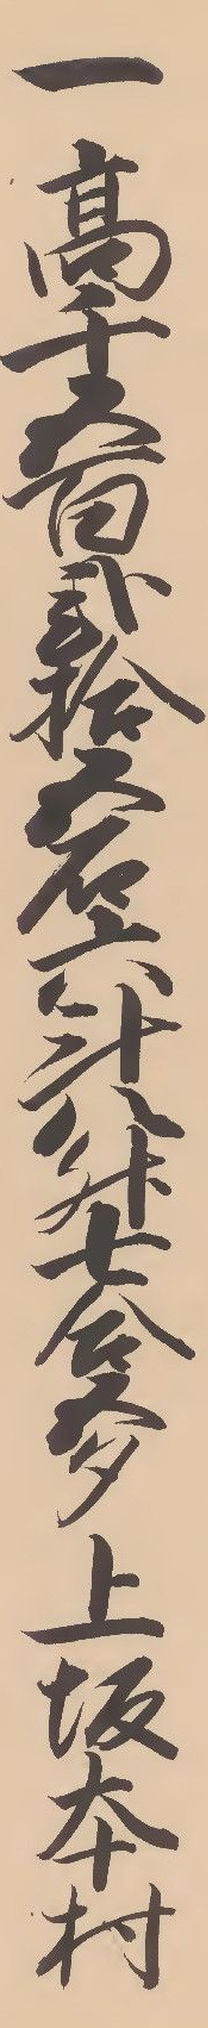一高千五百弐拾五石六斗八升七合五勺上坂本村
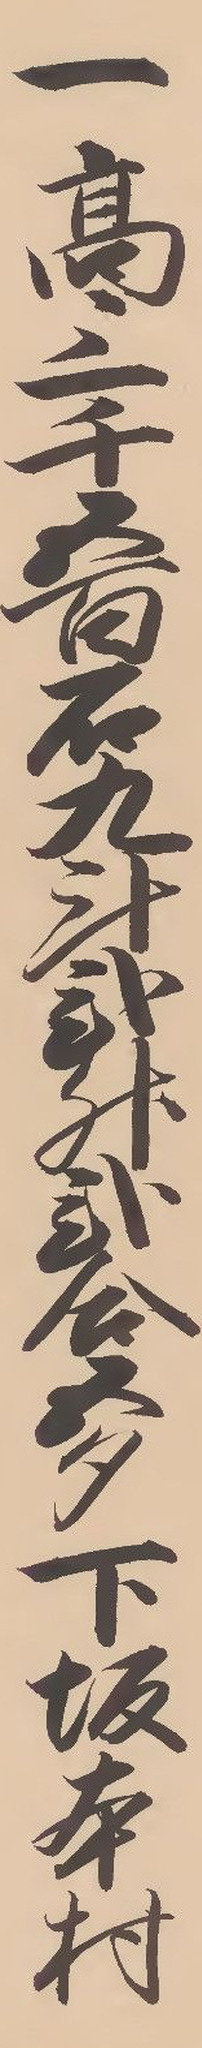一高三千五百石九斗弐升弐合五勺下坂本村
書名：近江国郷帳
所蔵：国立公文書館 National Archives of Japan
